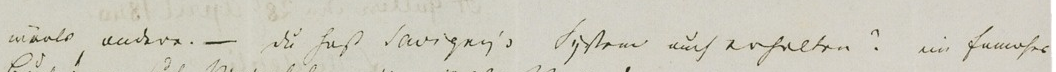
wärts andere. – Du hast Savigny's System auch erhalten? ein famoses
